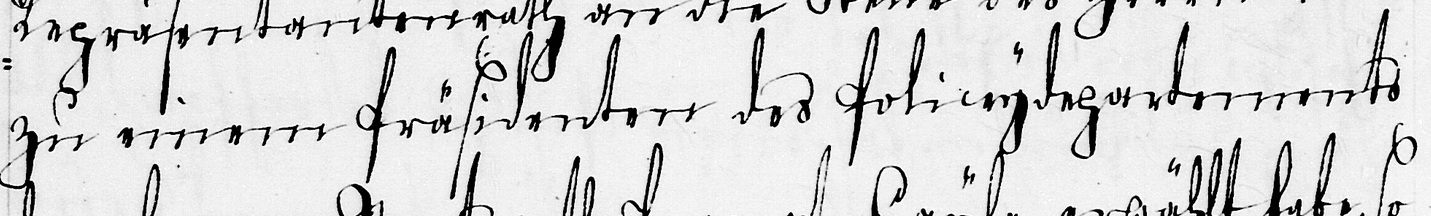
zu einem Präsidenten des Policeydepartements
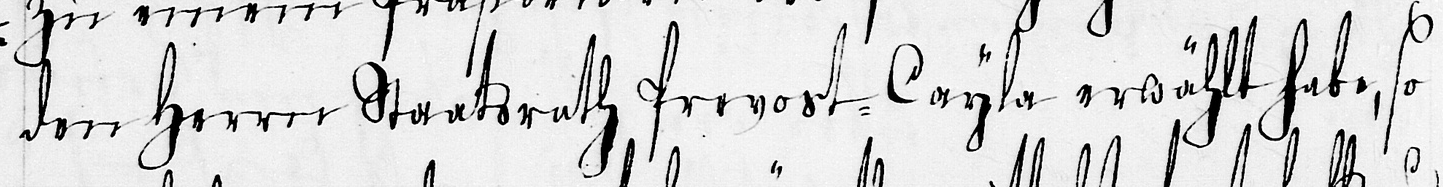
den Herrn Staatsrath Prevost-Cayla erwählt habe, so
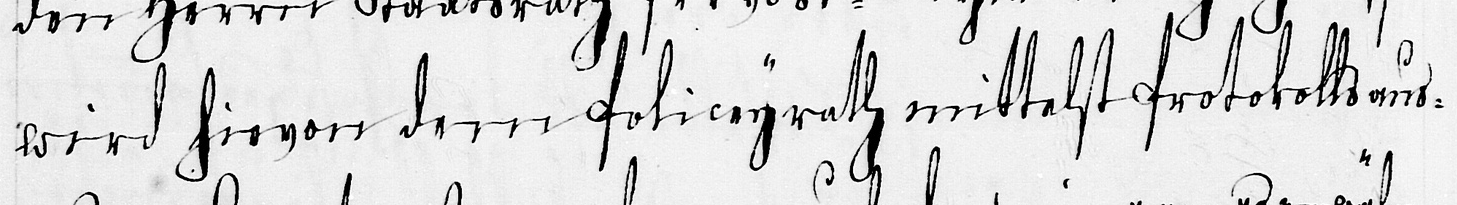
wird hievon dem Policeyrath mittelst Protokollsaus¬
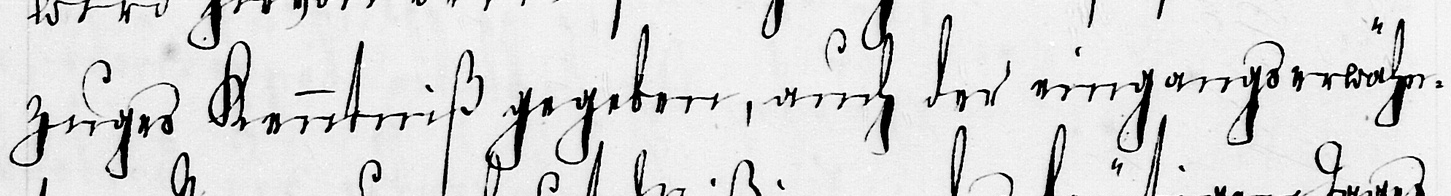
zuges Kenntniß gegeben, auch der eingangserwähn¬
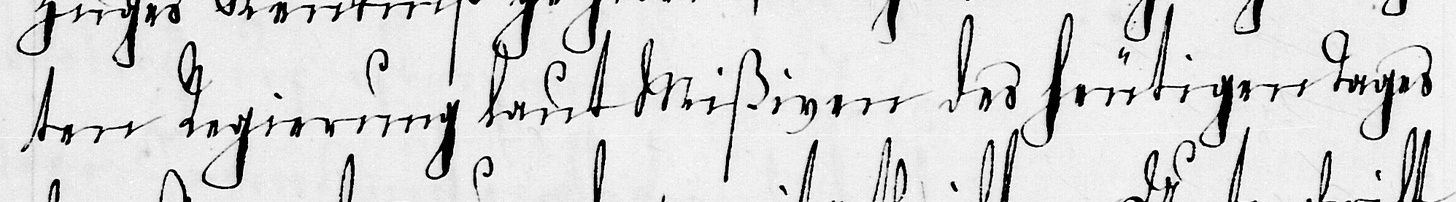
ten Regierung laut Mißiven des heutigen Tages
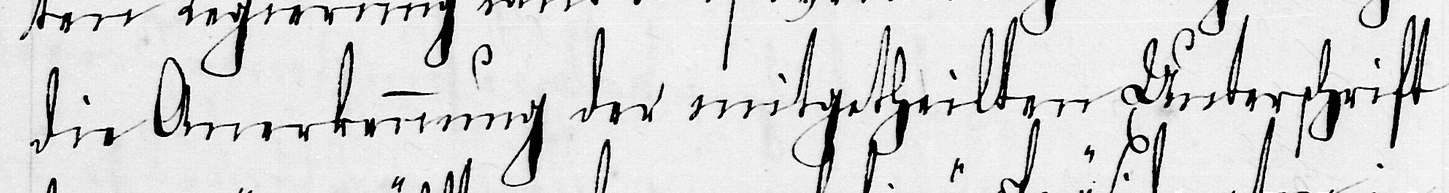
die Anerkennung der mitgetheilten Unterschrift
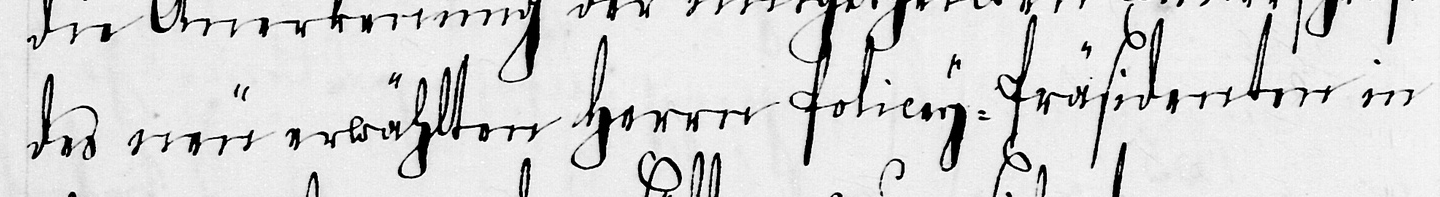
des neu erwählten Herrn Policey-Präsidenten in
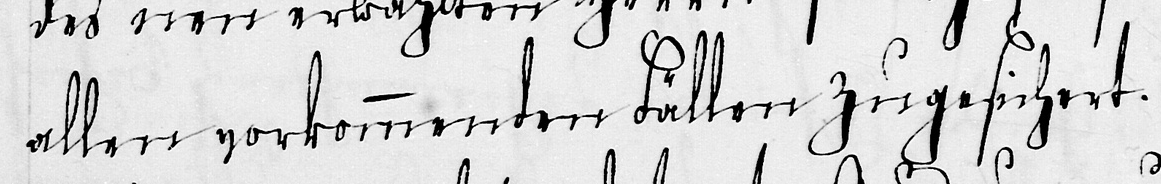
allen vorkommenden Fällen zugesichert.
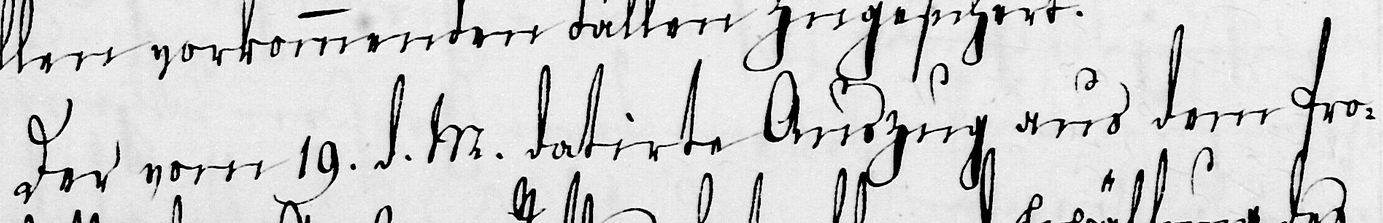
Der vom 19. d. M. datirte Auszug aus dem Pro¬
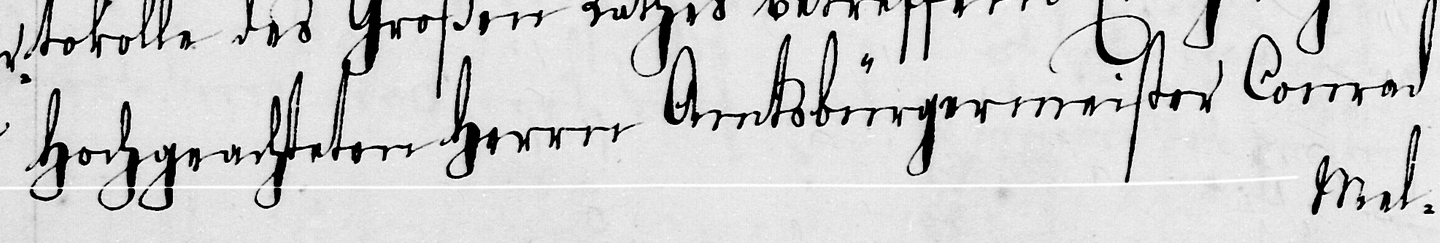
Hochgeachteten Herrn Amtsbürgermeister Conrad
